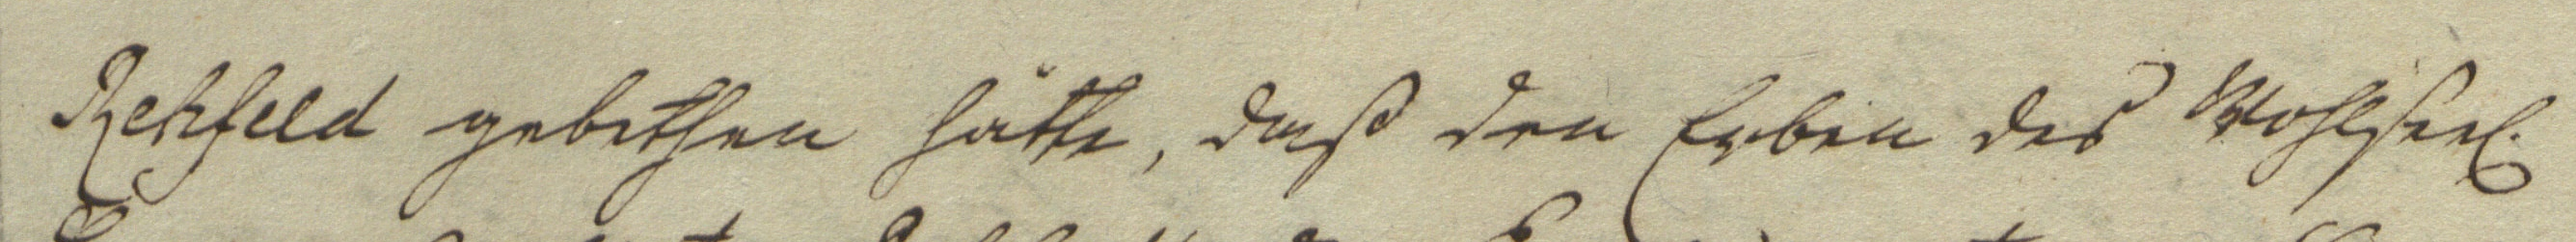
Rehfeld gebethen hätte, daß den Erben des Wohlseel.
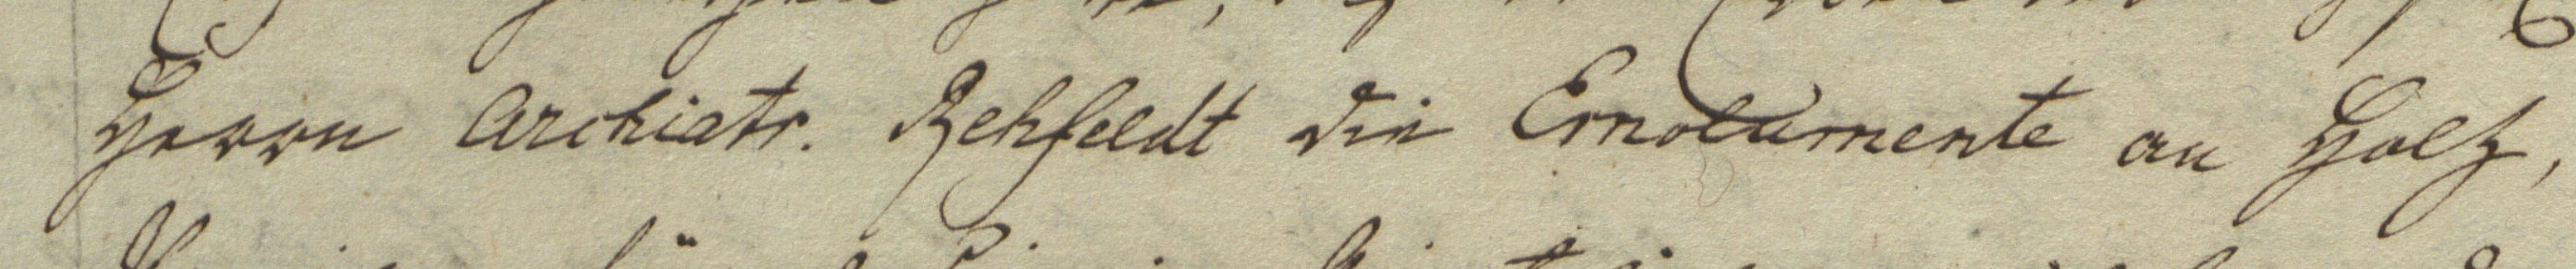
Herrn Archiatr. Rehfeldt die Emolumente an Holz,
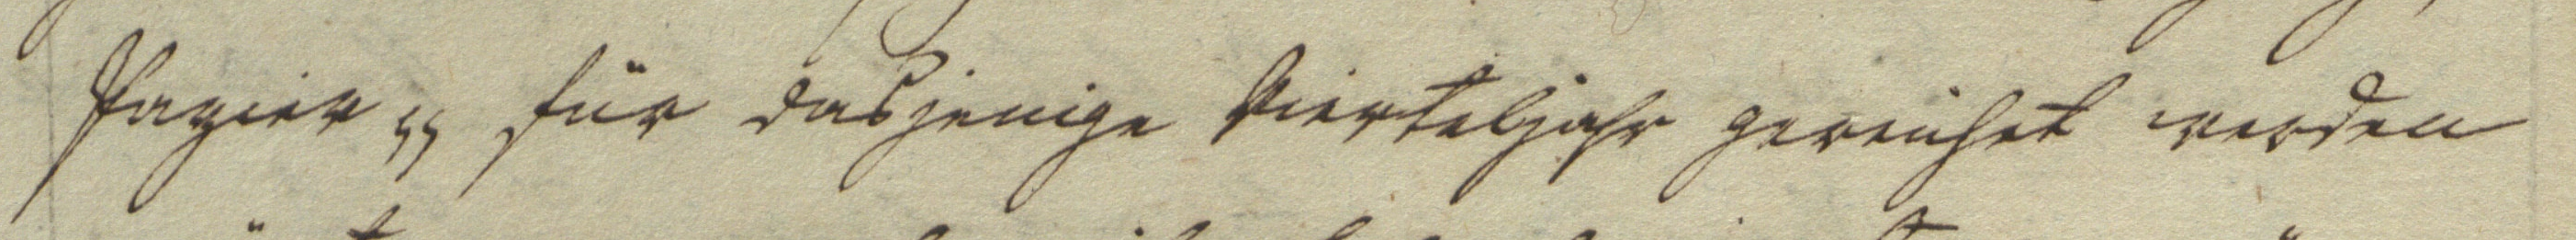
Papier für dasjenige Vierteljahr gereichet werden
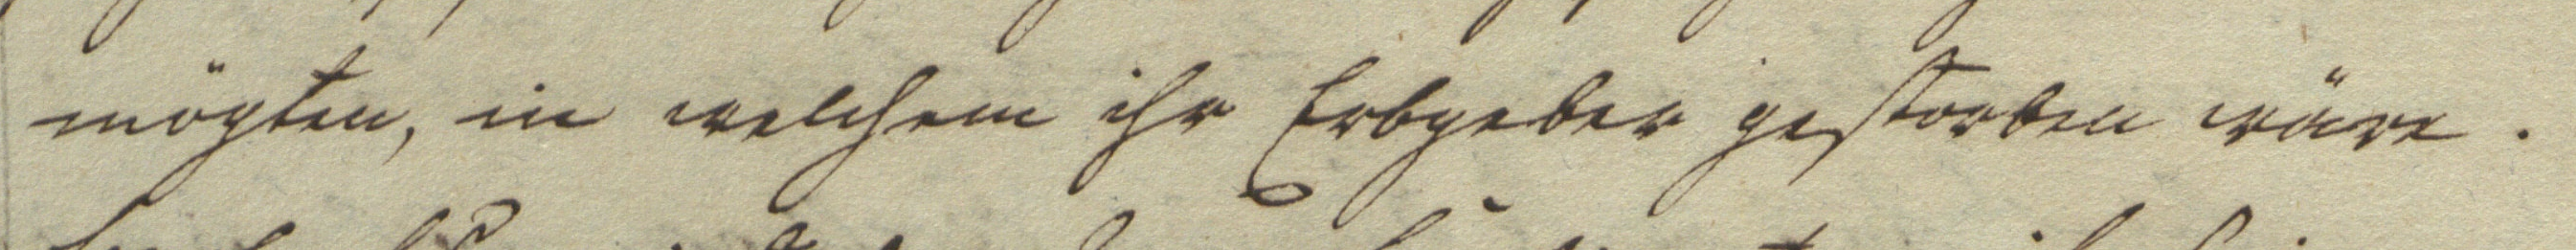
mögten, in welchem ihr Erbgeber gestorben wäre.
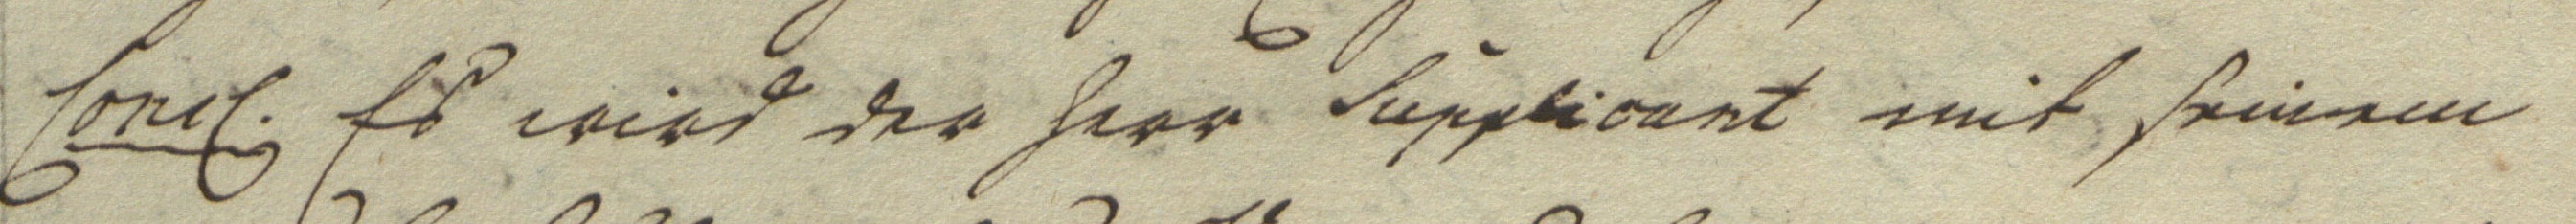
Concl. Es wird der Herr Supplicant mit seinem
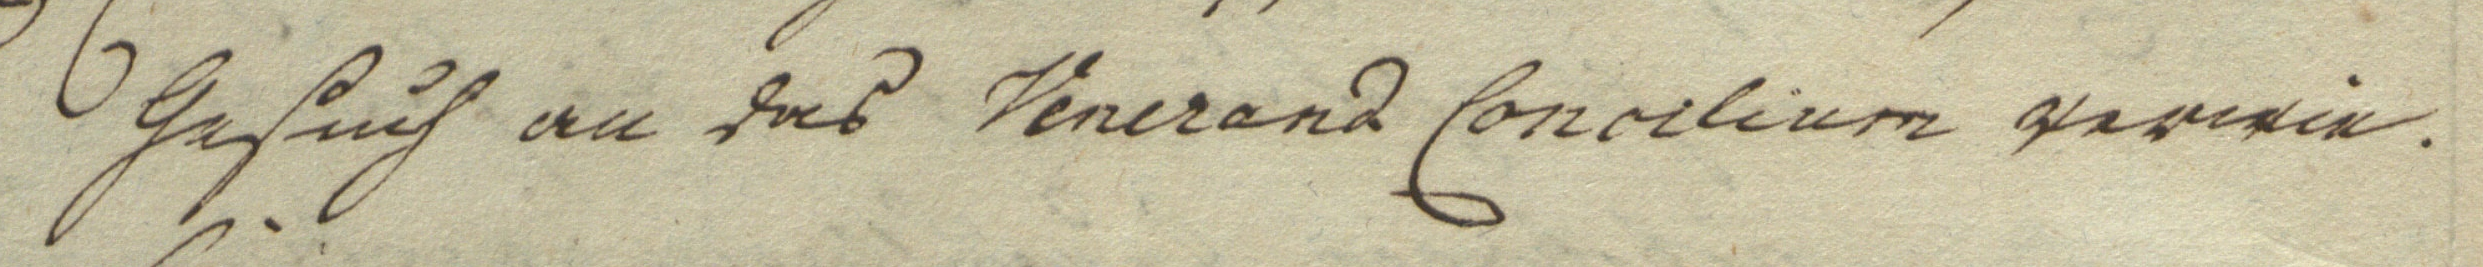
Gesuch an das Venerand. Concilium verwie¬
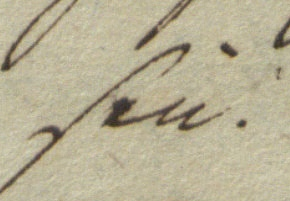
sen.
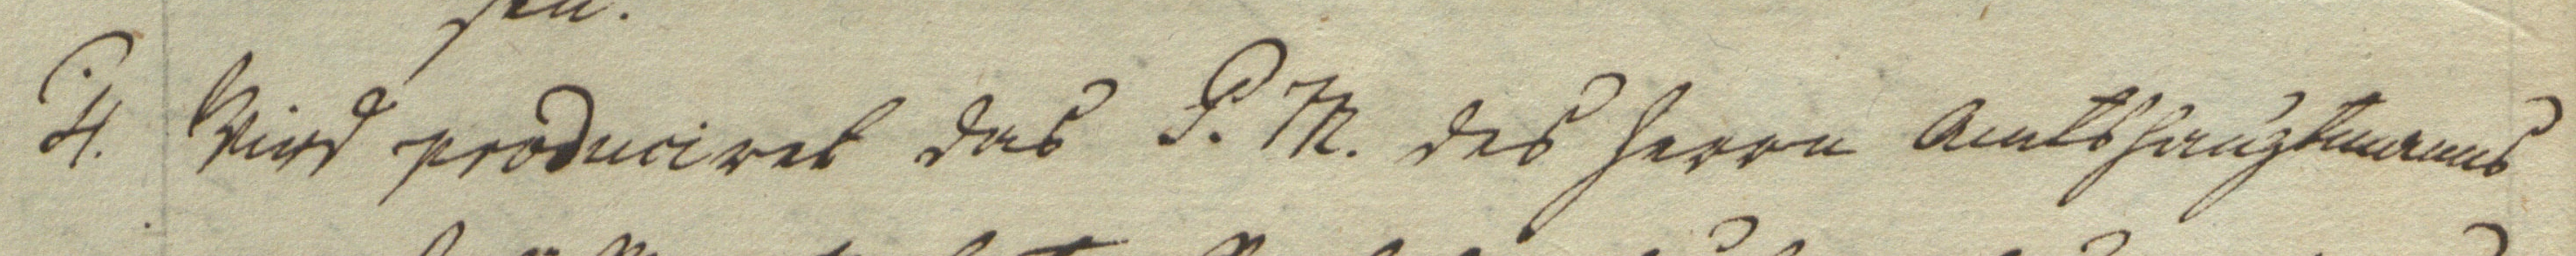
4. Wird produciret das P. M. des Herrn Amtshauptmanns
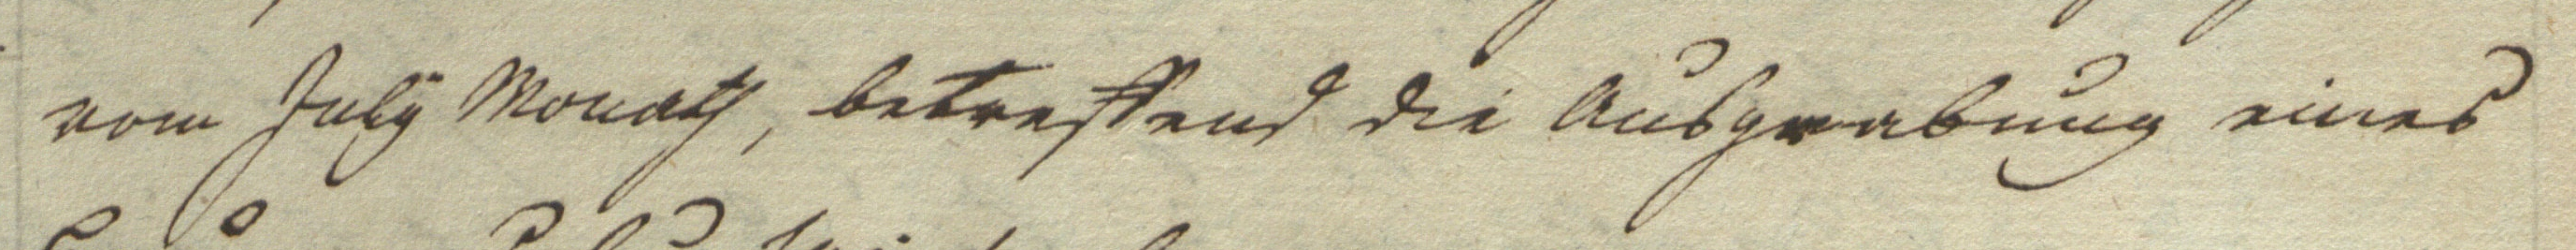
vom Julÿ Monath, betreffend die Ausgrabung eines
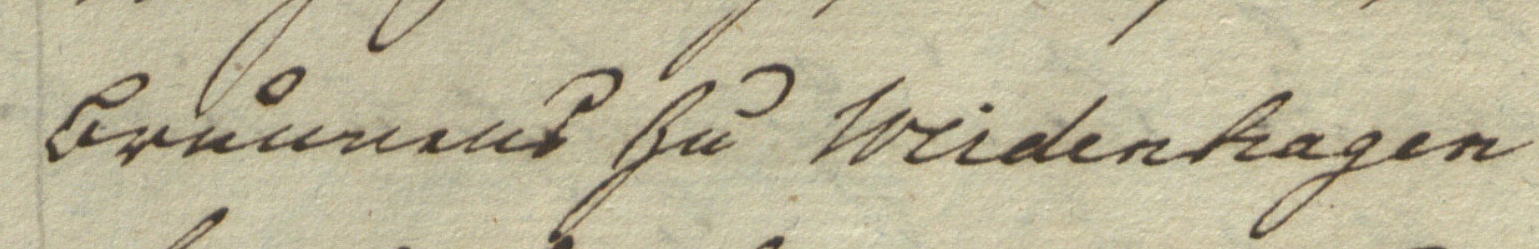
Brunnens zu Weidenhagen
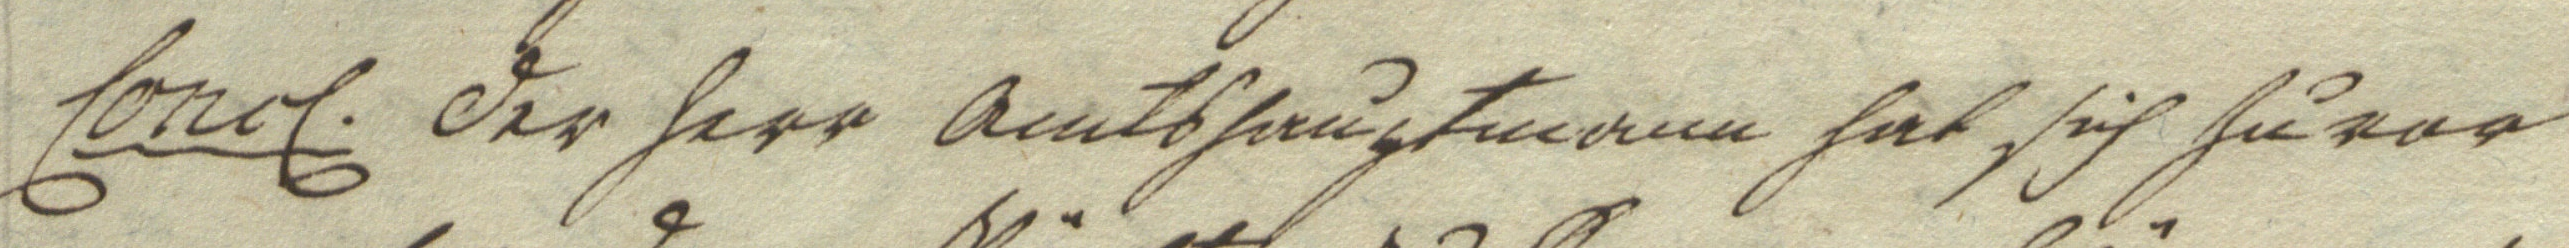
Concl. Der Herr Amtshauptmann hat sich zuvor
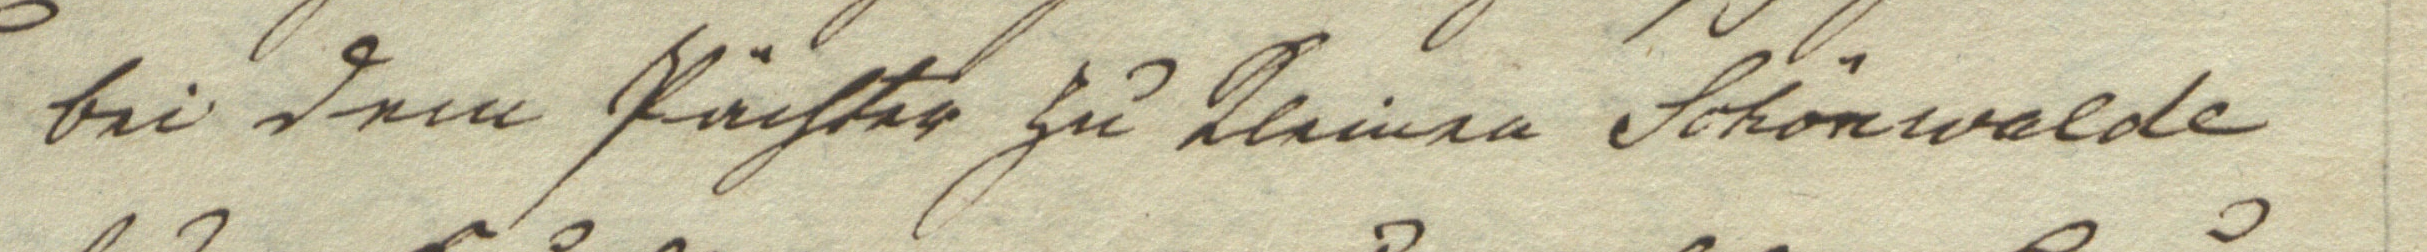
bei dem Pächter zu Kleinen Schönwalde
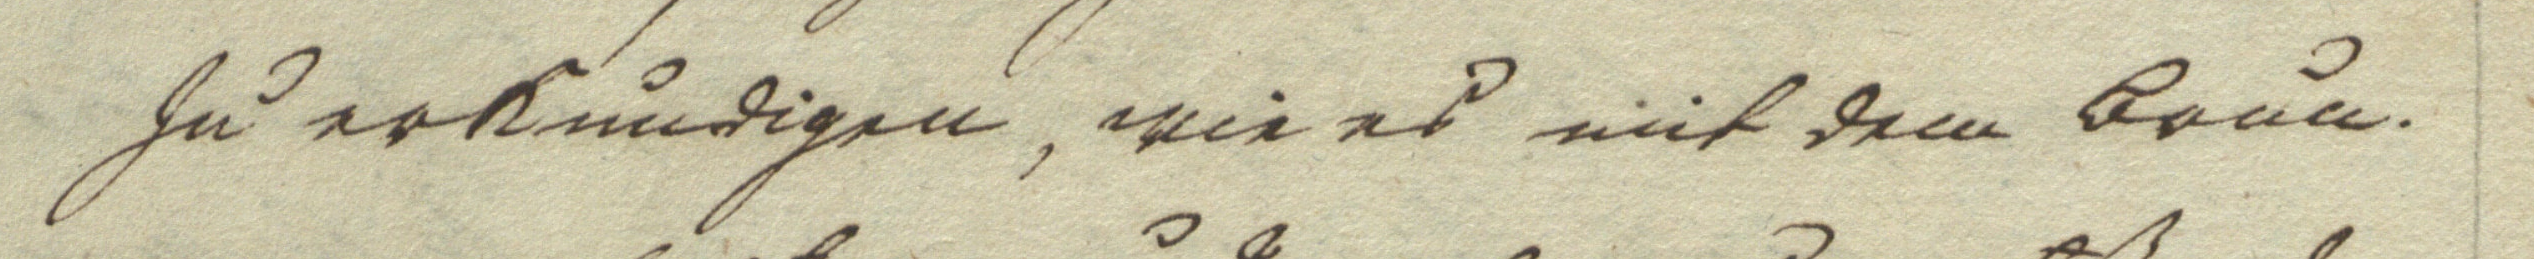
zu erkundigen, wie es mit dem Brun¬
